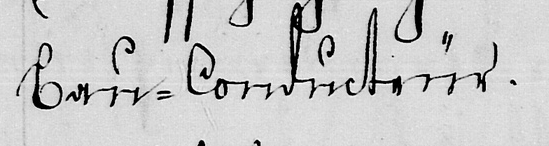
Bau-Conducteur.
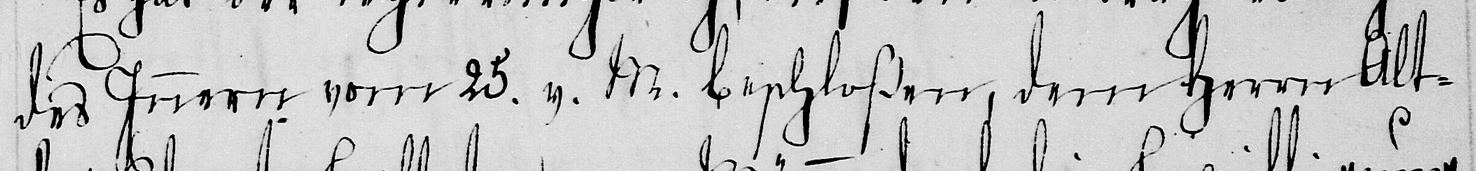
des Innern vom 25. v. M. beschloßen, dem Herrn Alt-P¬
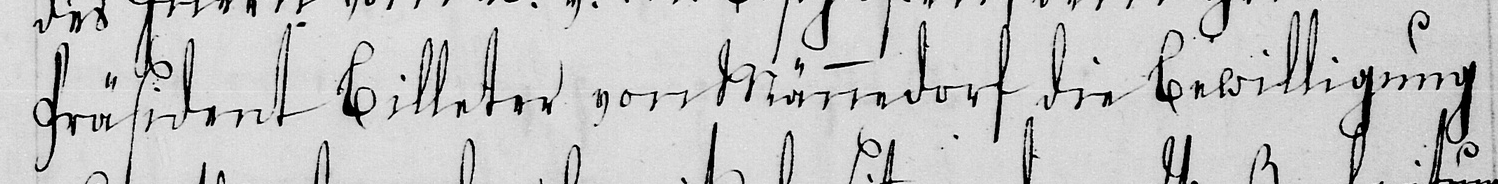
räsident Billeter von Männedorf die Bewilligung
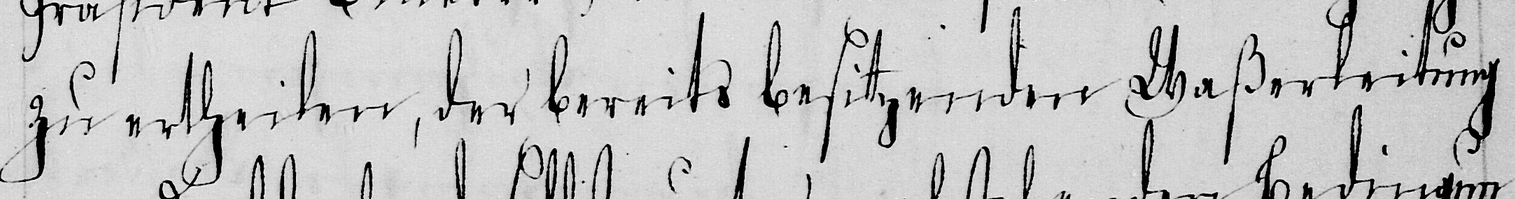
zu ertheilen, der bereits besitzenden Waßerleitung
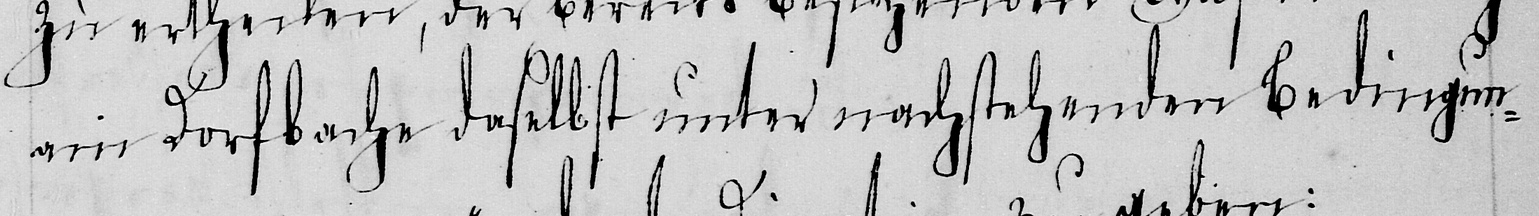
am Dorfbache daselbst unter nachstehenden Bedingun¬
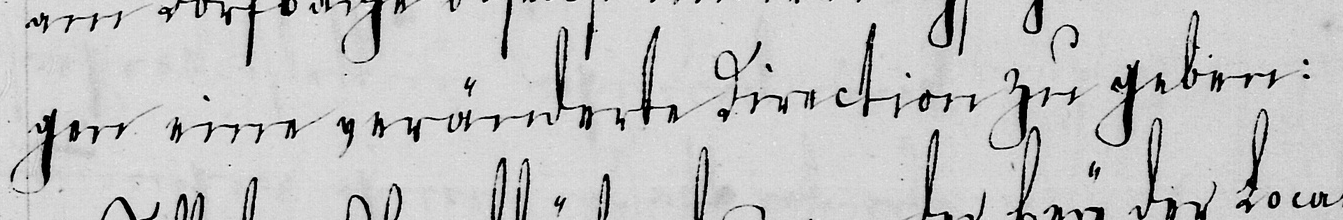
gen eine veränderte Direction zu geben:
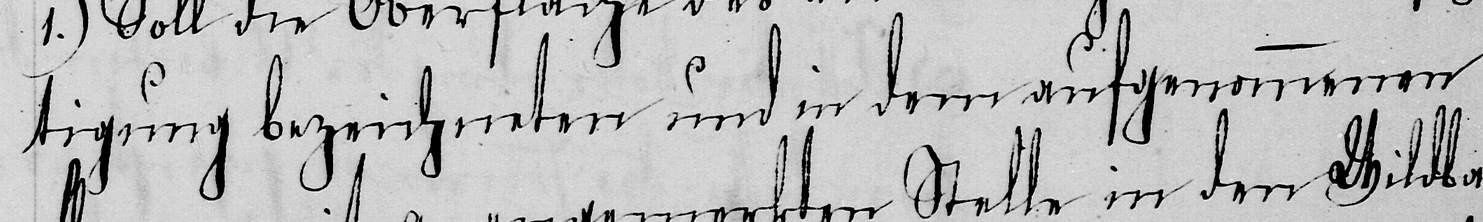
htigung bezeichneten und in dem aufgenommenen
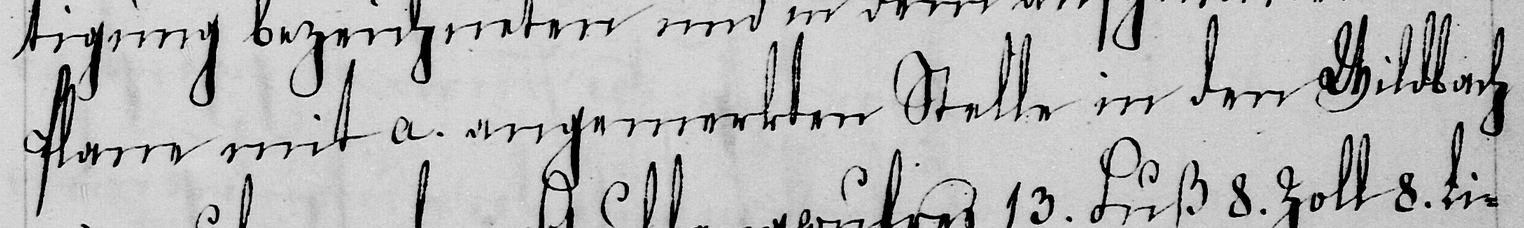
Plane mit a. angemerkten Stelle in den Wildbach
